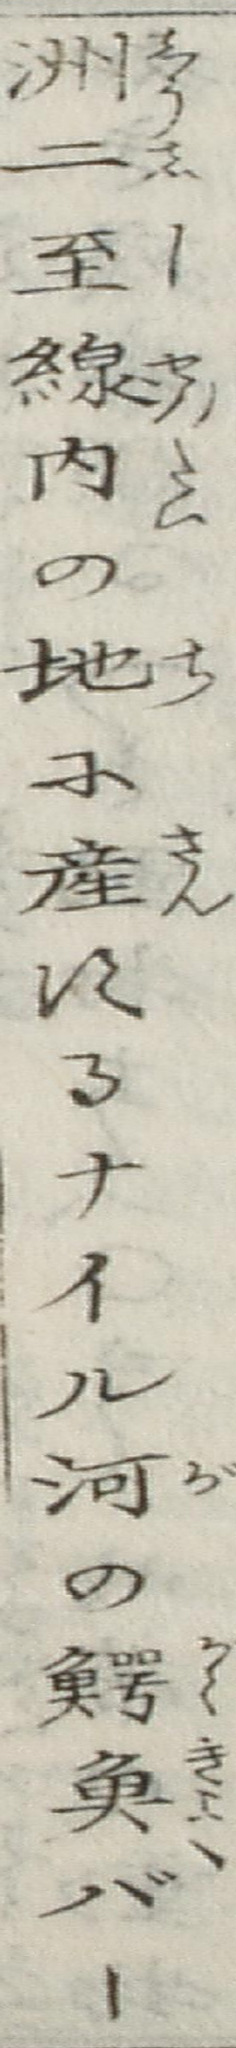洲二至線内の地に産するナイル河の鰐魚、バー
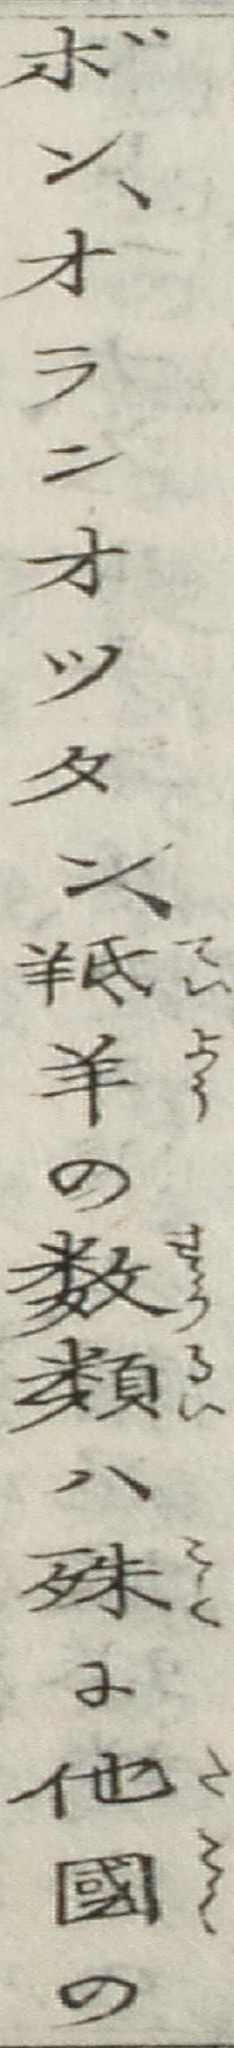ボン、オランオツタン、羝羊の数類は殊に他国の
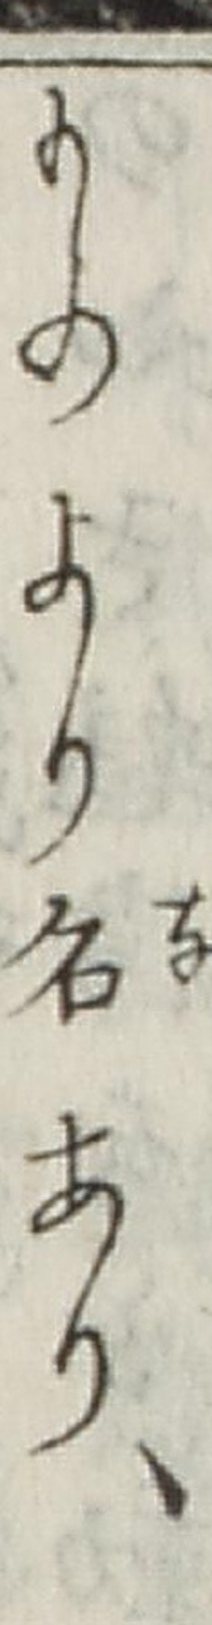ものより名あり、
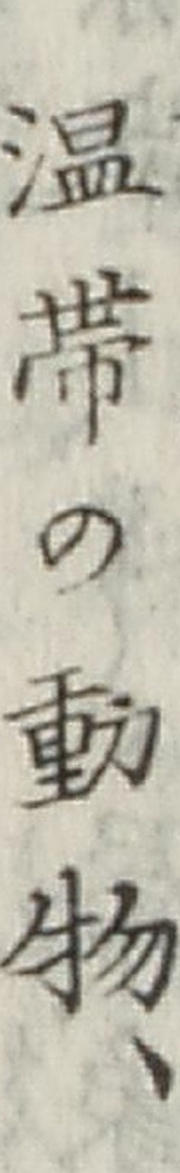温帯の動物、
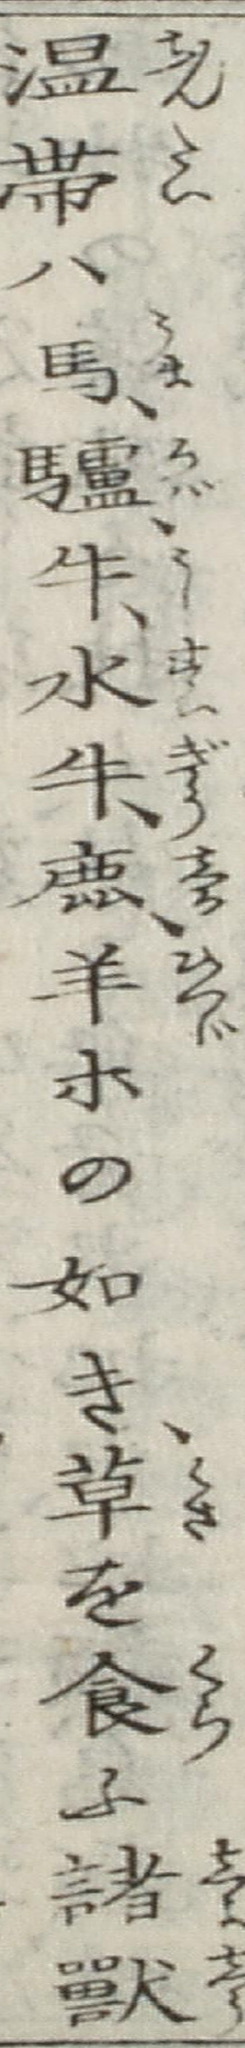温帯は馬、驢、牛、水牛、鹿、羊等の如き、草を食ふ諸獣
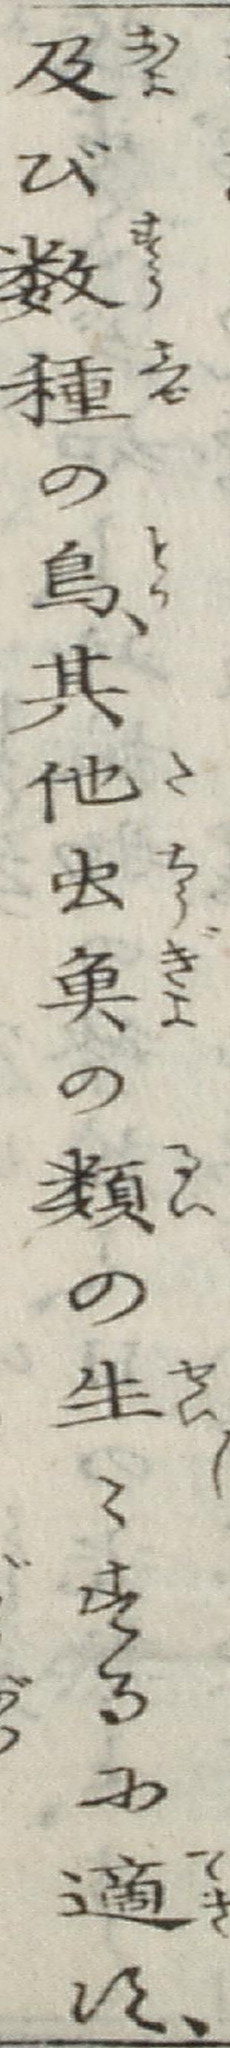及び数種の鳥、其他虫魚の類の生々するに適す、
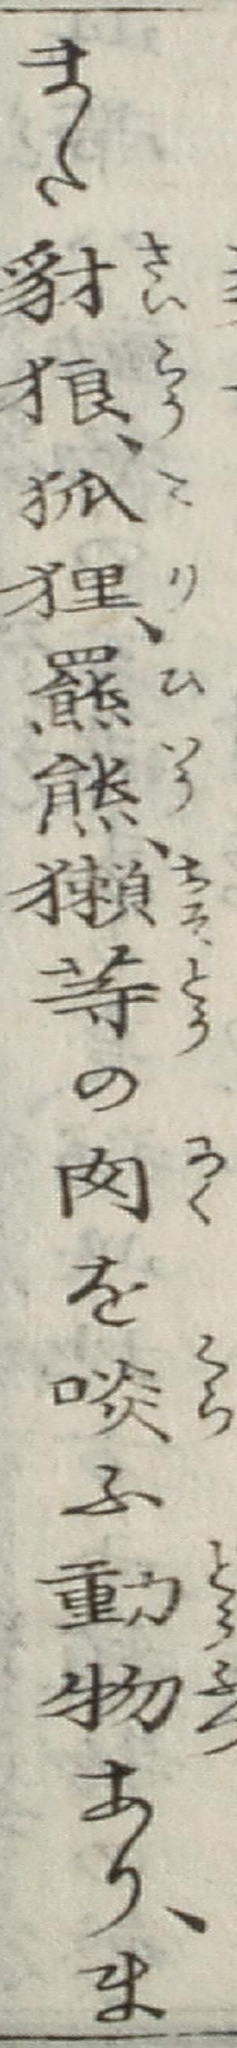また豺狼、狐狸、羆熊、獺等の肉を啖ふ動物あり、ま
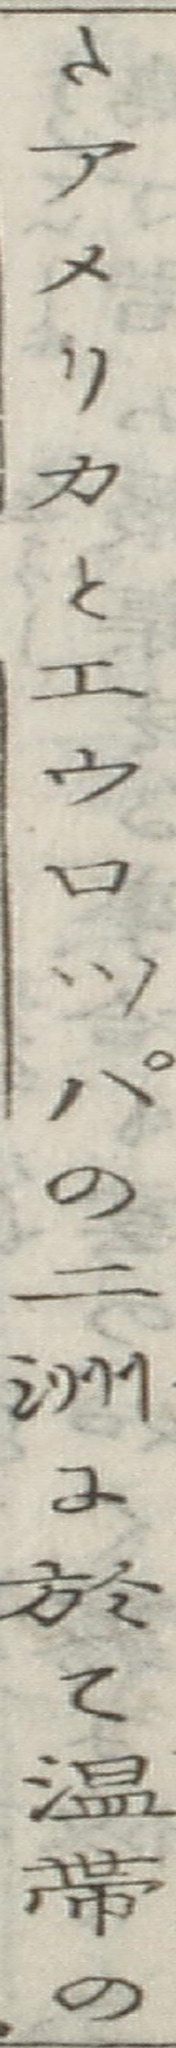たアメリカとエウロツパの二洲に於て温帯の
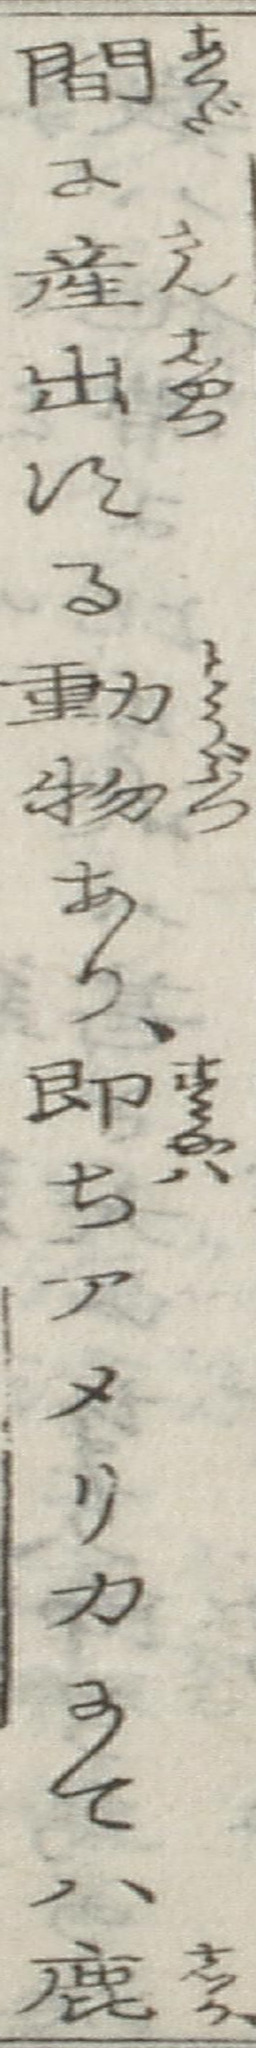間に産出する動物あり、即ちアメリカにては鹿、
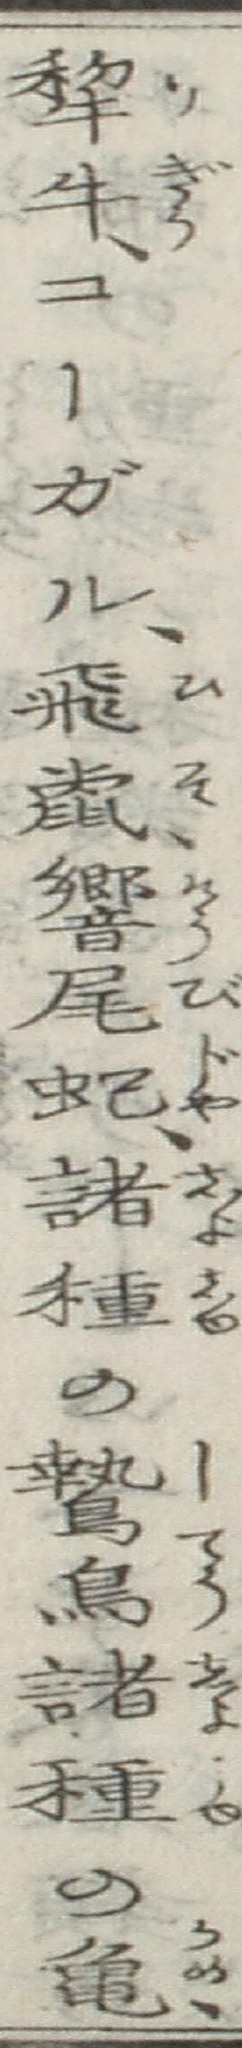犂牛、コーガル、飛鼠、響尾蛇、諸種の鷙鳥諸種の亀、
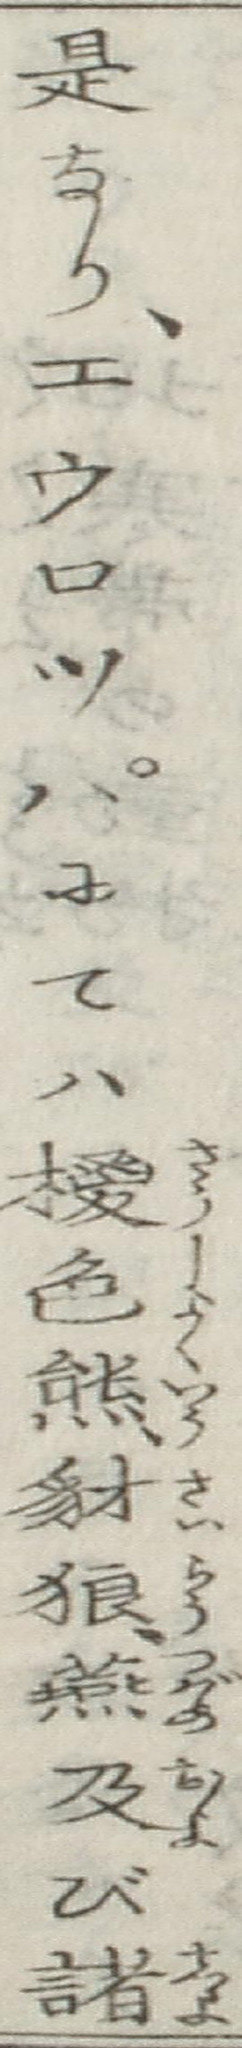是なり、エウロツパにては椶色熊、豺狼、燕及び諸
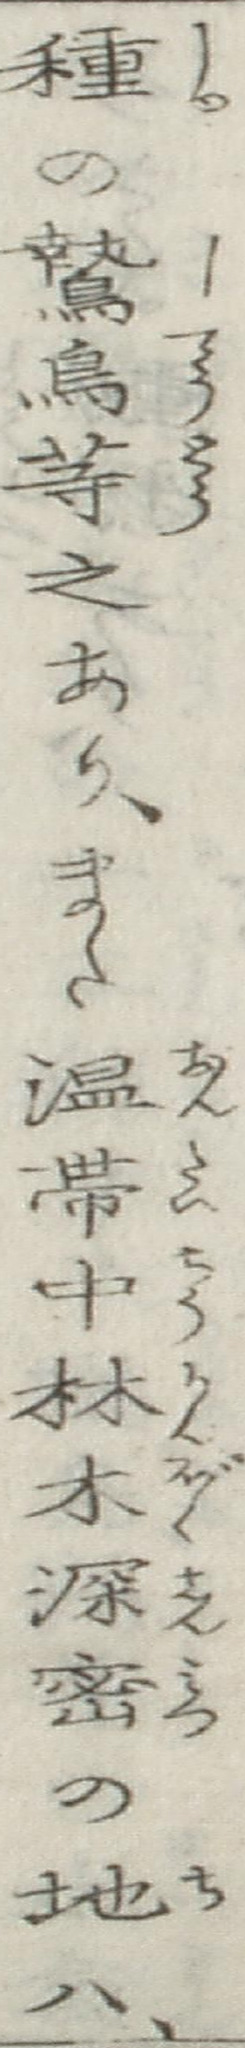種の鷙鳥等之あり、また温帯中林木深密の地は、
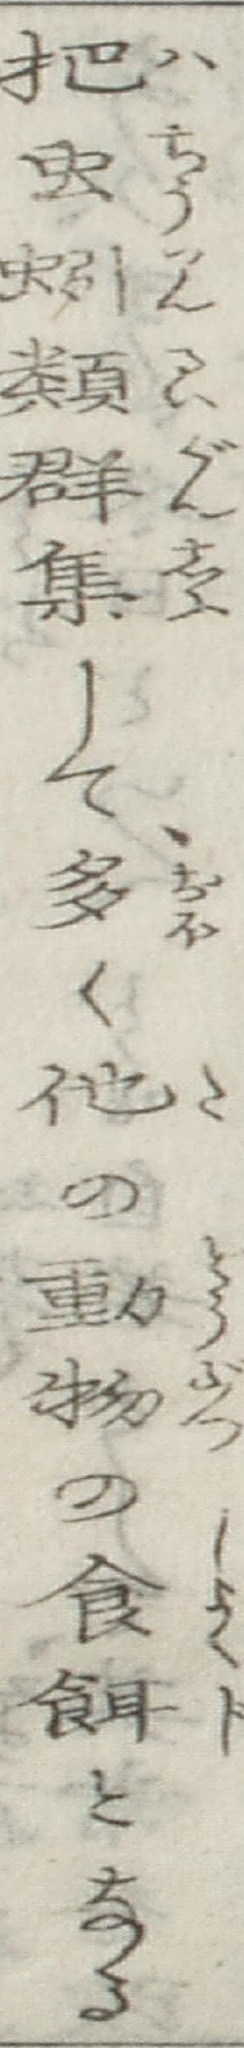把虫蚓類群集して、多く他の動物の食餌となる
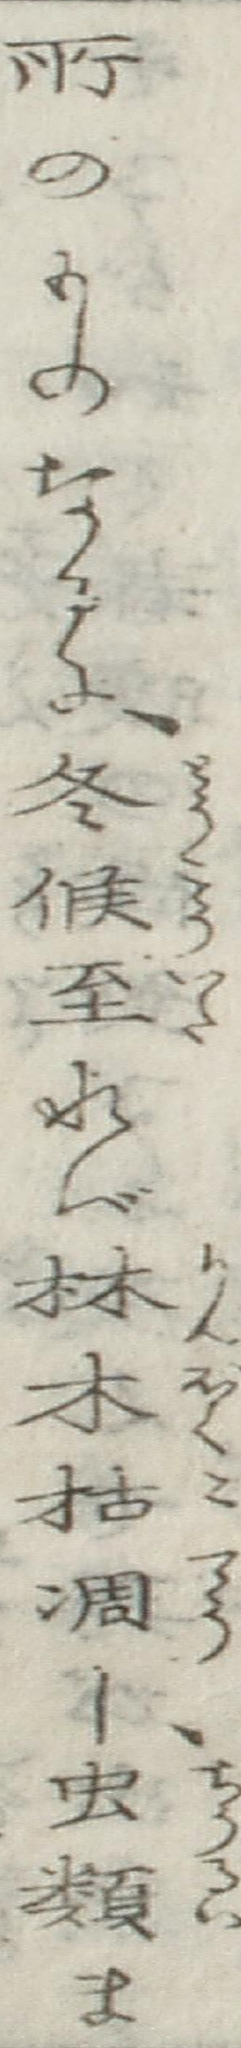所のものなるに、冬候至れば林木枯凋し、虫類ま
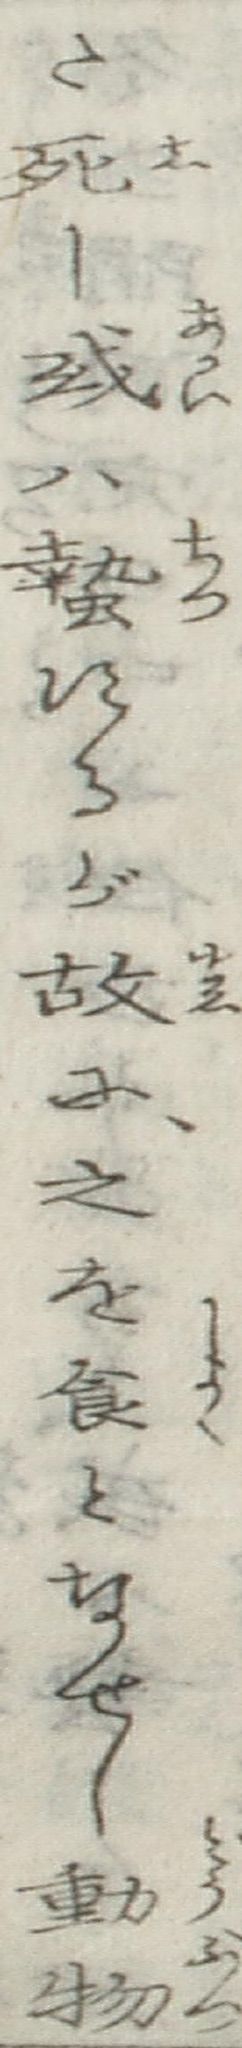た死し或は蟄するが故に、之を食となせし動物
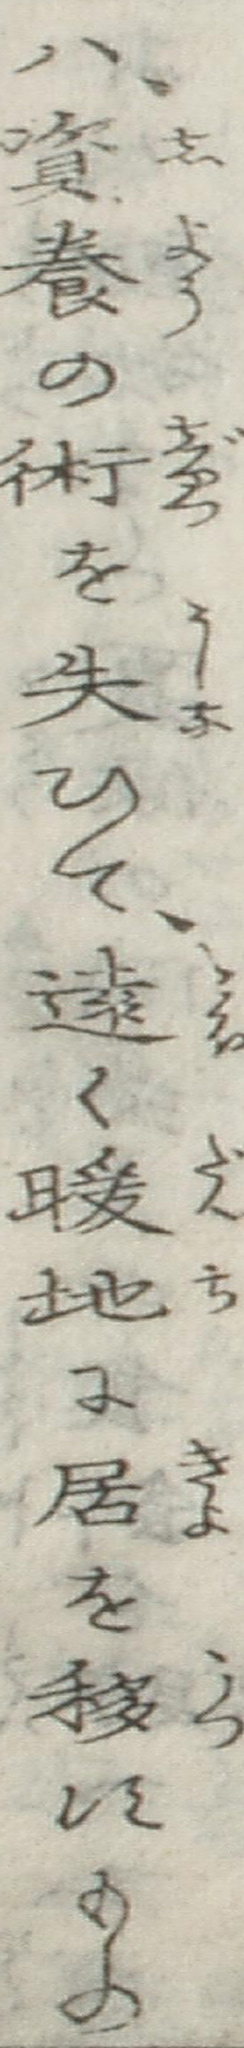は、資養の術を失ひて、遠く暖地に居を移すもの
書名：訓蒙　天然地理學　下
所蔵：東京大学地震研究所図書室 Earthquake Research Institute Library, The University of Tokyo, JAPAN
